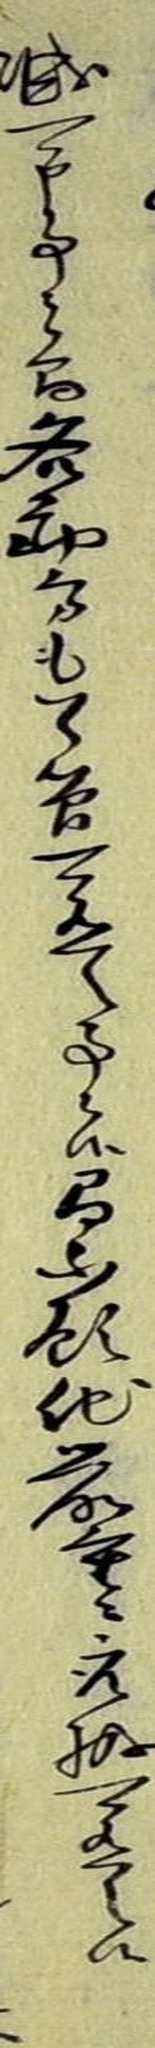減可申事に候間各勤方も了簡可有之事に候間不顧他厳重に取扱可有之候
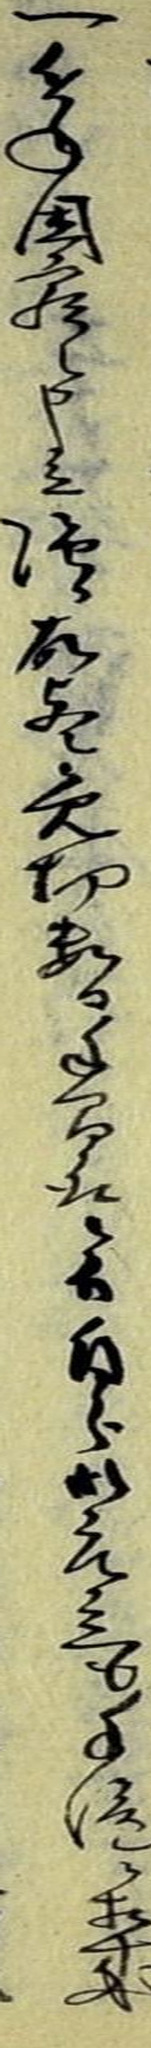一近年困窮之申立強く故歟免切数日手間取候に付自ら御取立も手後れに相成
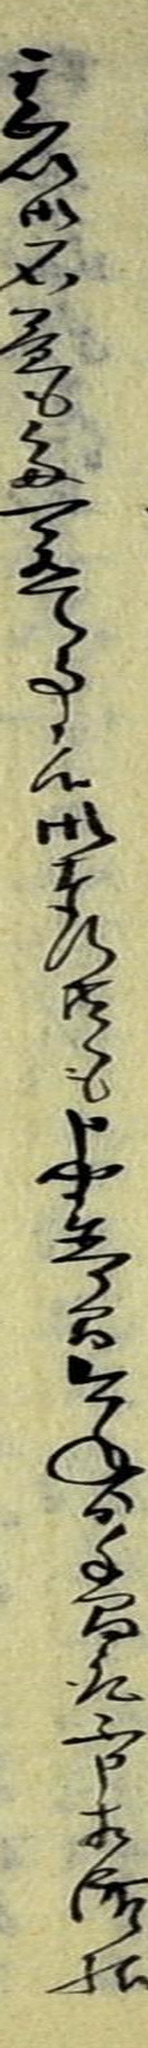甚以御不益も多可有之事に候御奉行共へも申聞置候間今年ゟ手間取不申相済様
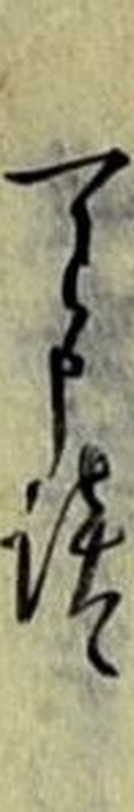可被申談候
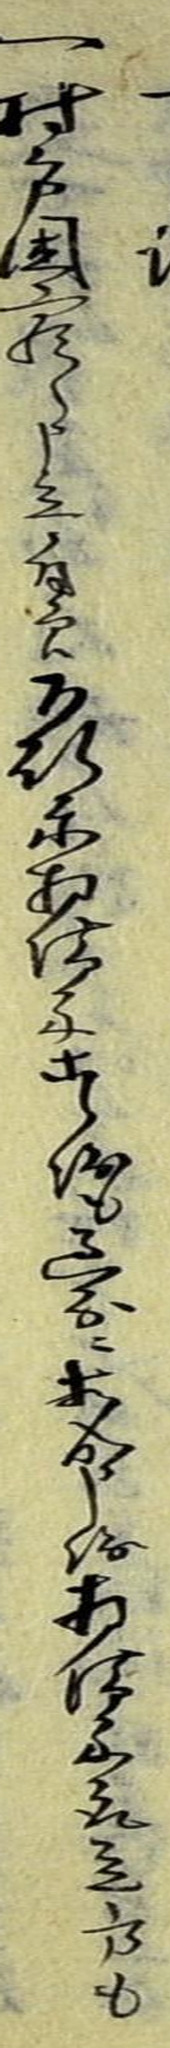一村方困窮之申立に付而は下行米拝借米等之儀も過分に相成申儀拝借米取立方も
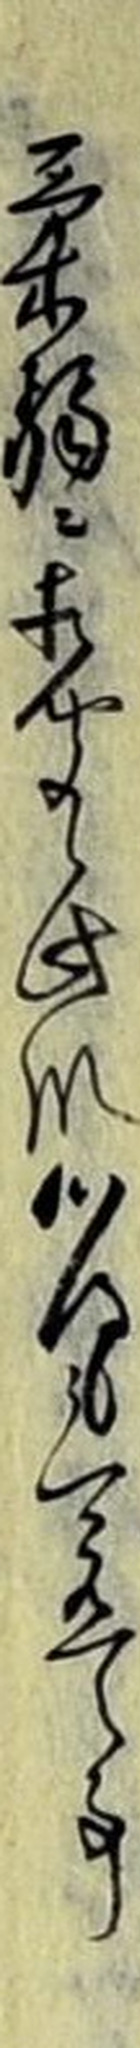柔弱に相聞此段心得も可有之事
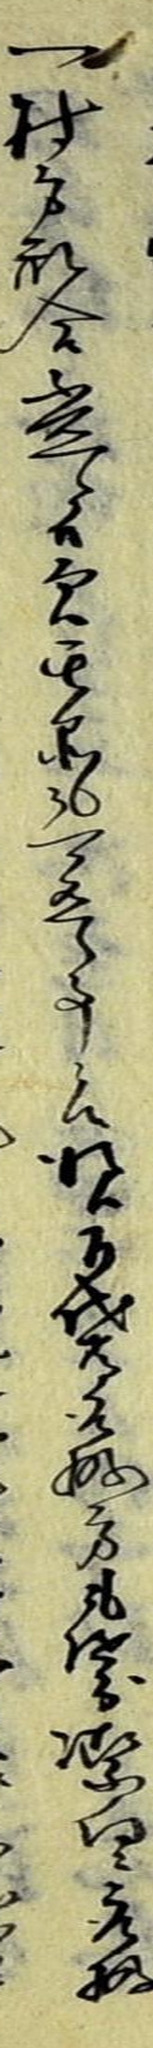一村方形合不宜候に付而は其品も可有之事に候得は下代共取扱も随分潔白に取扱
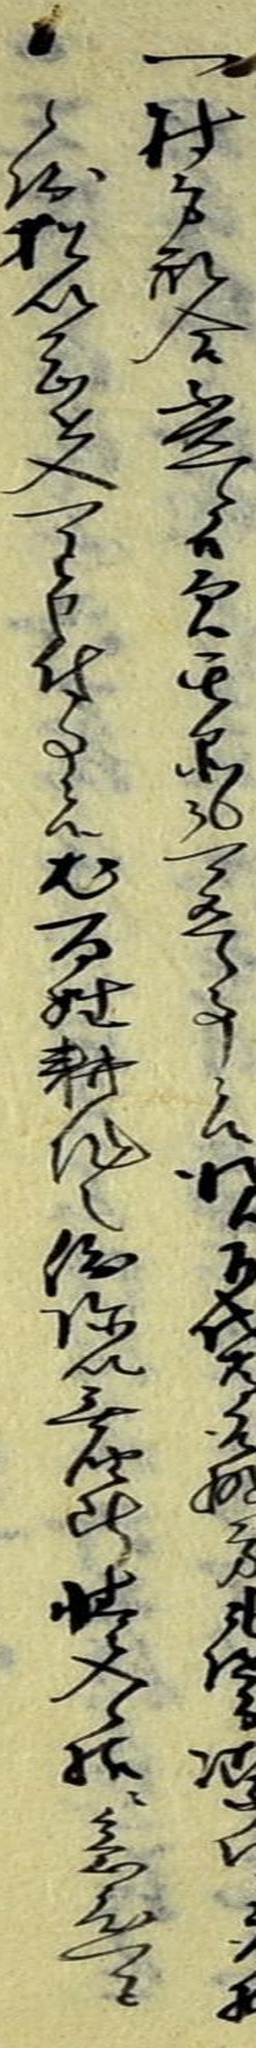候儀猶以念を入可被申付事に候尤百姓耕作之儀弥以無油断精に入候様に急度可被
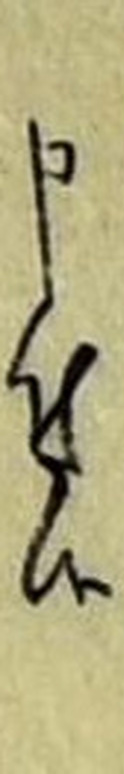申付候

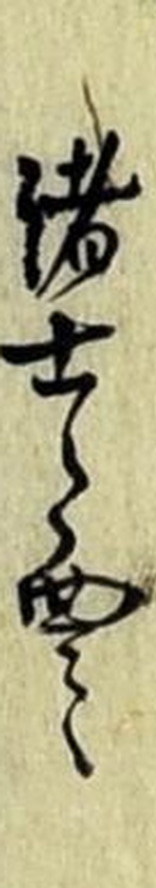諸士之面々
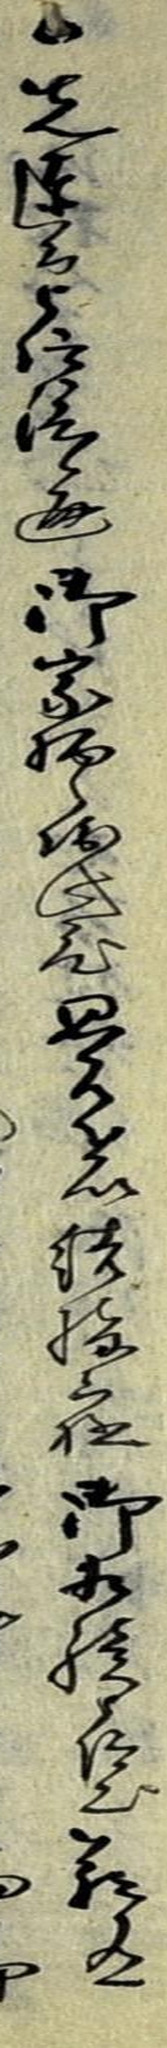〇先達而被仰渡候通御家柄之儀此度思召を以結構至極御相続被仰出難有
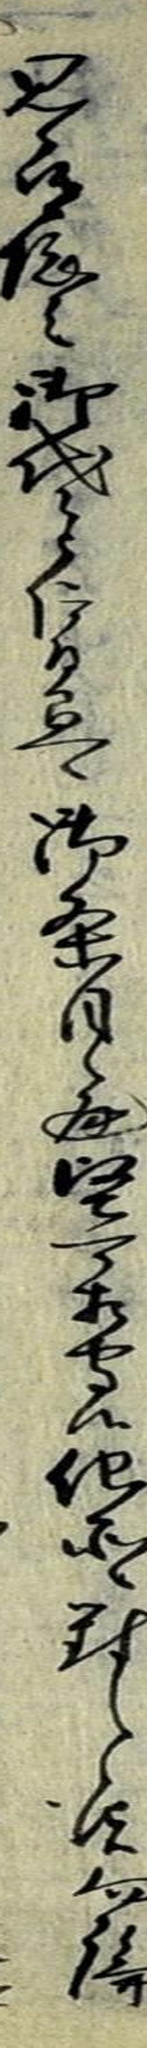思召依之御代々被仰付置候御条目之通堅可相守候他所へ対し候儀は勿論
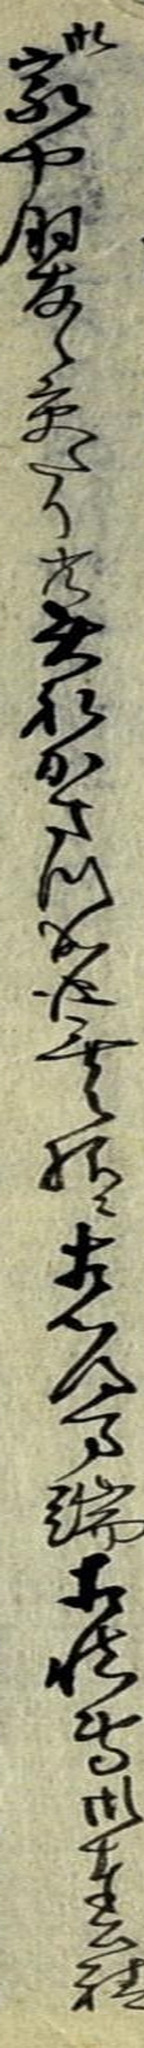家中朋友之交たり共失礼かさつ成儀無之様に相心得万端相慎専御奉公精
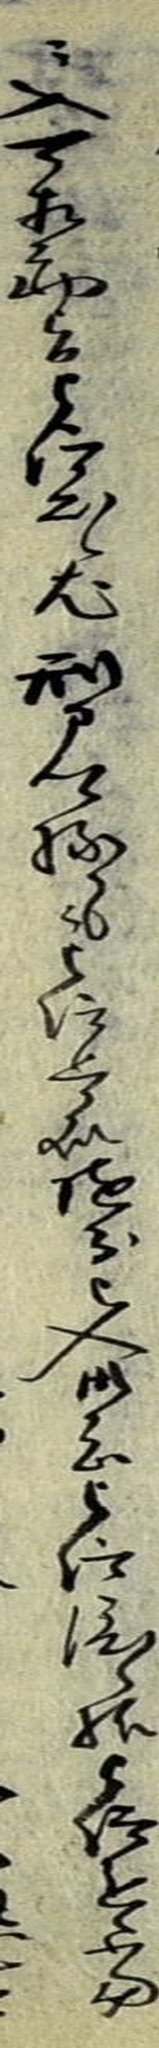に入可相勤旨被仰出候尤刑部卿様へも被仰上候処随分被入御念被仰渡候様被仰進候当
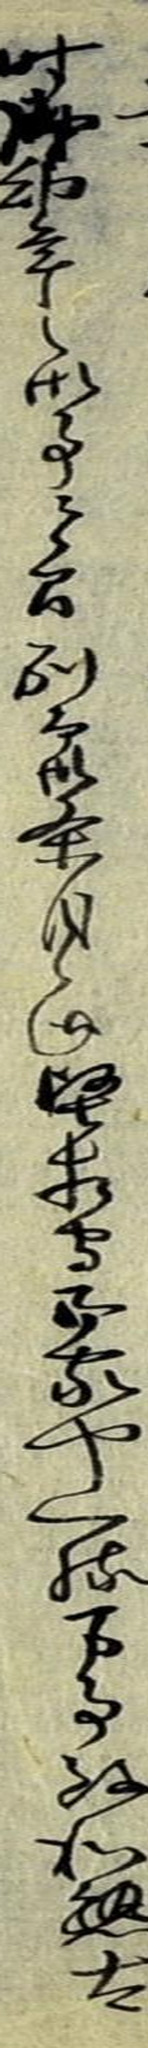時御幼年之御事に候間別而御条目之趣堅相守御家中一統万事致和熟太
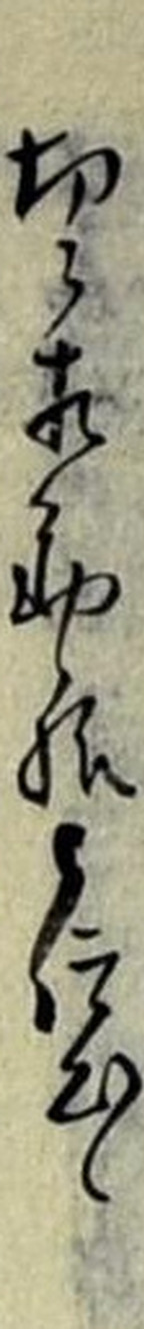切に相勤様被仰出候
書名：命令之部 二
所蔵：福井県文書館 Fukui Prefectural Archives
